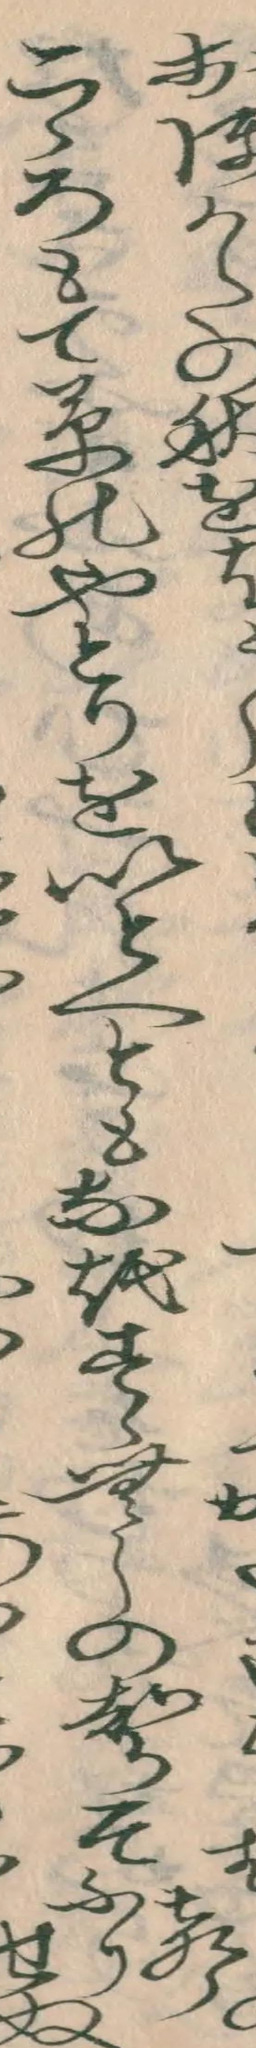こゝろもて草のやとりをいとへともなをすゝむしの聲そふり
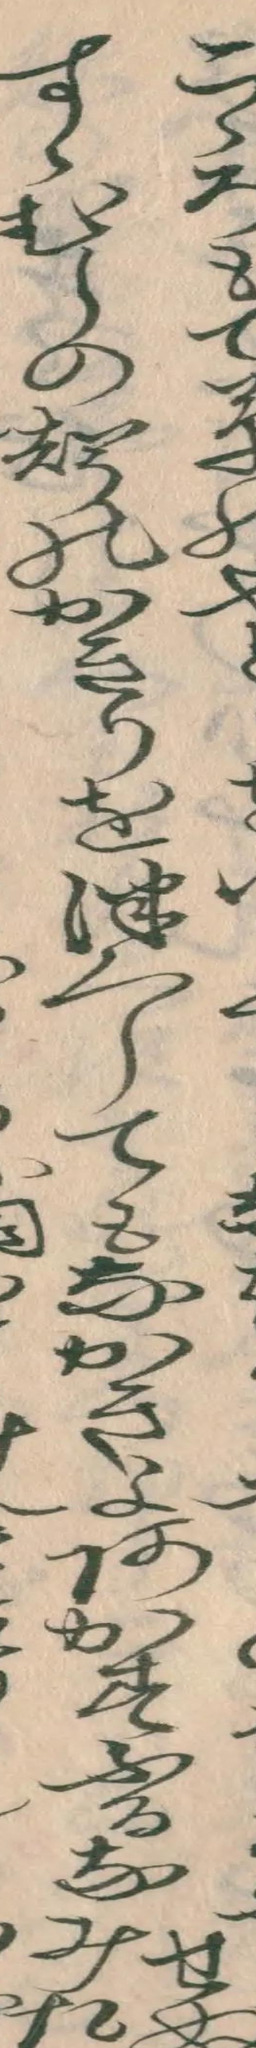すゝむしの聲のかきりをつくしてもなかきよあかすふるなみた
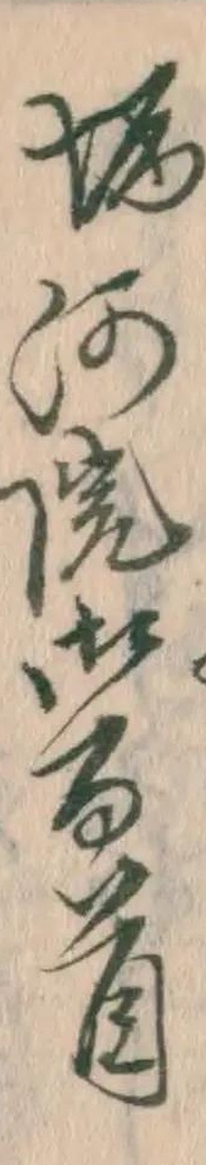堀河院御百首
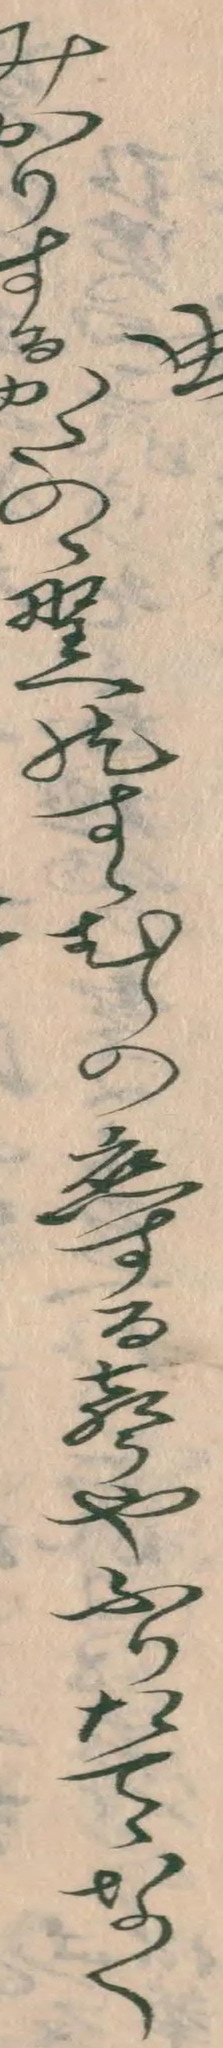みかりするかたのゝ野へのすゝむしの恋する聲やふりたてゝなく
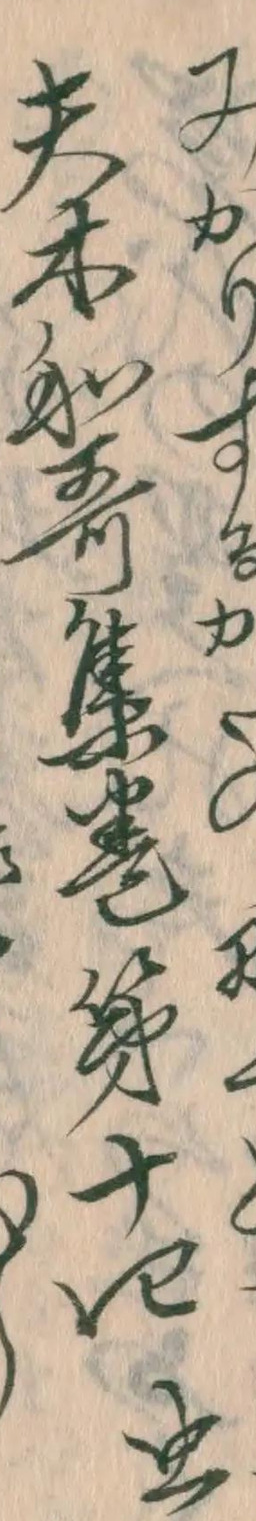夫木和哥集巻第十四虫
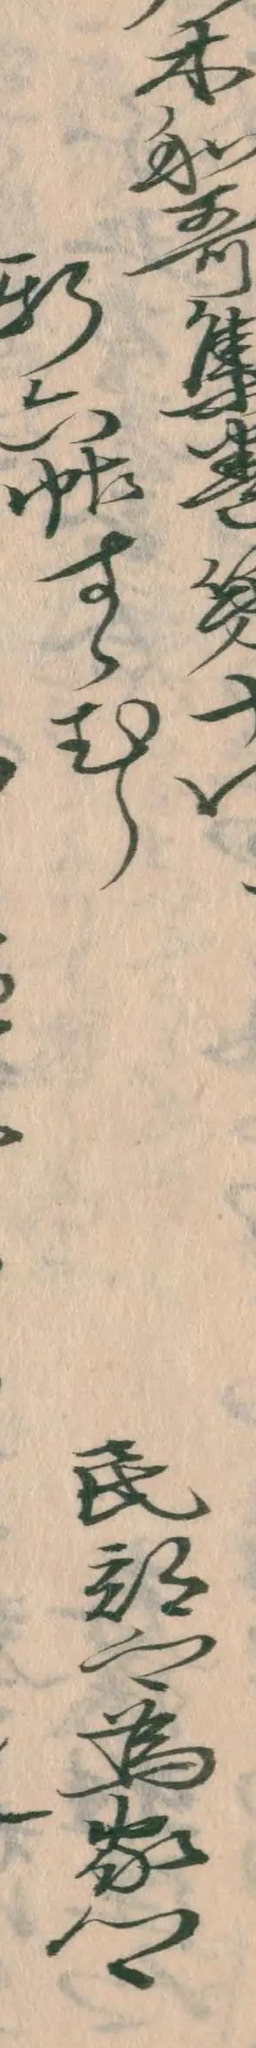新六帖すゝむし民部卿為家卿
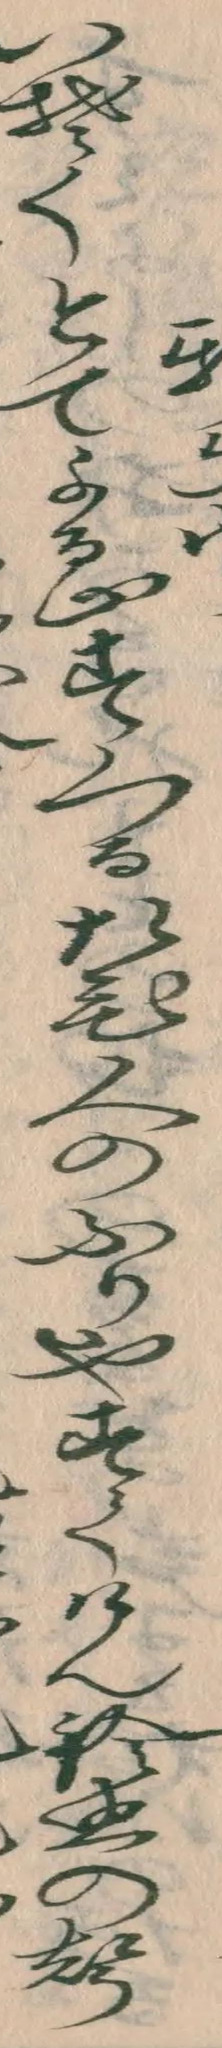いそくとてよる山すくるたひ人のふりやすてけん鈴虫の聲
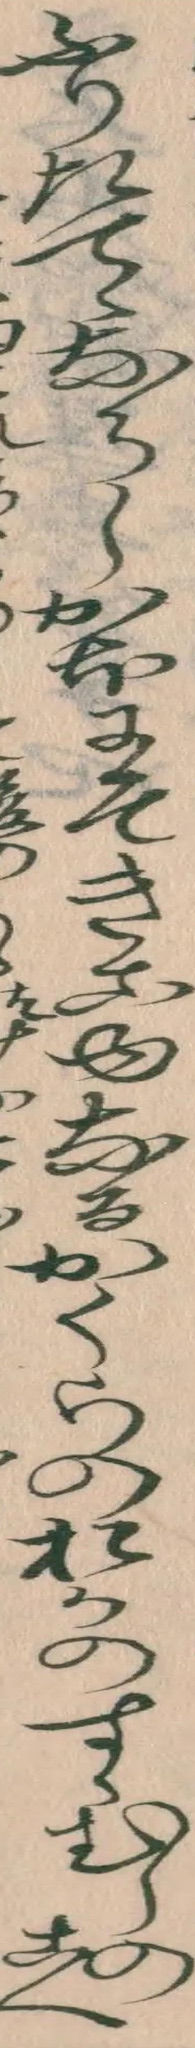ふりたてゝならしかほにそきこゆなるかくらのおかのすゝむしの
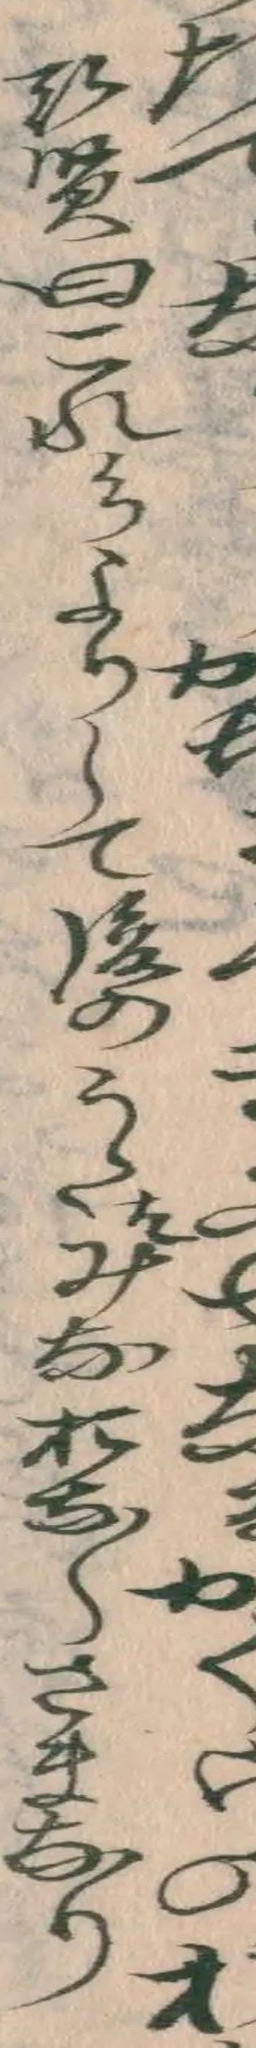弘賢曰これらよりして後のうたはみなおなしさまなり
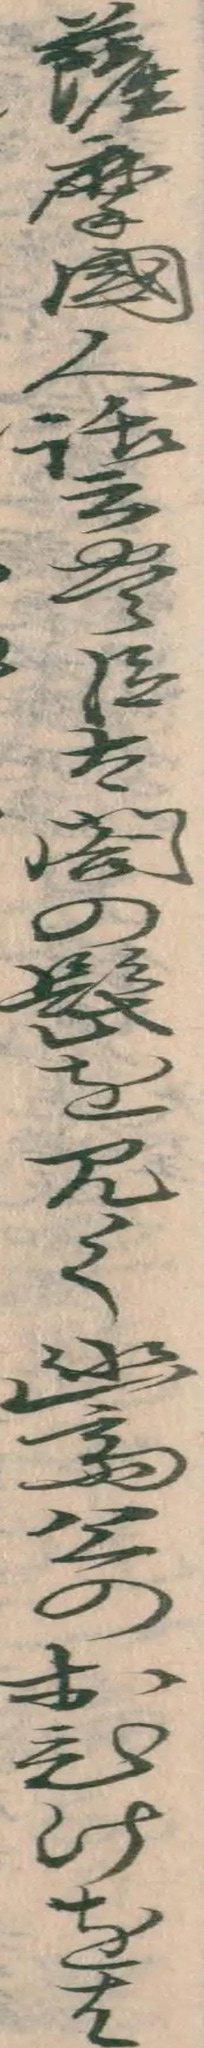薩摩国人話云豊臣太閣の髭を見て幽斎公のおひけをは
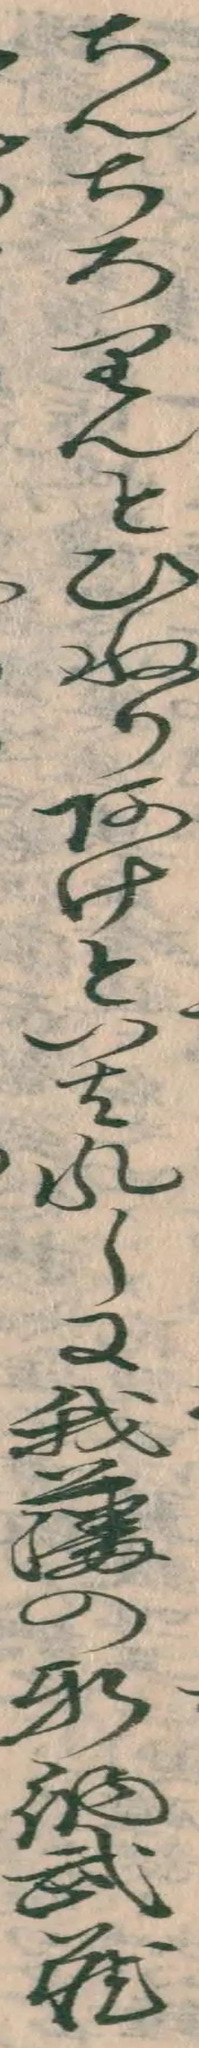ちんちろりんとひねりあけといはれしに我藩の新納武蔵
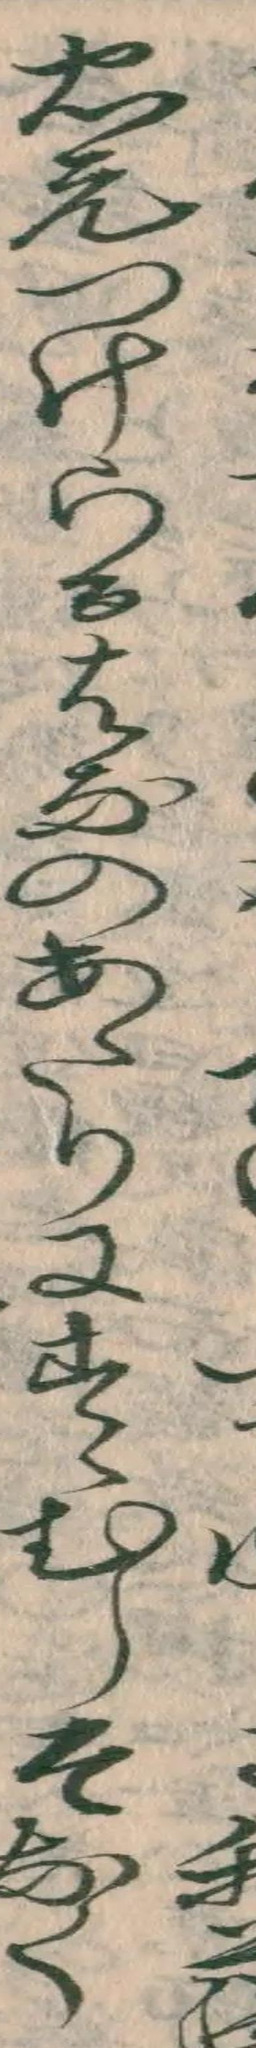忠元つけらるはなのあたりにすゝむしそなく

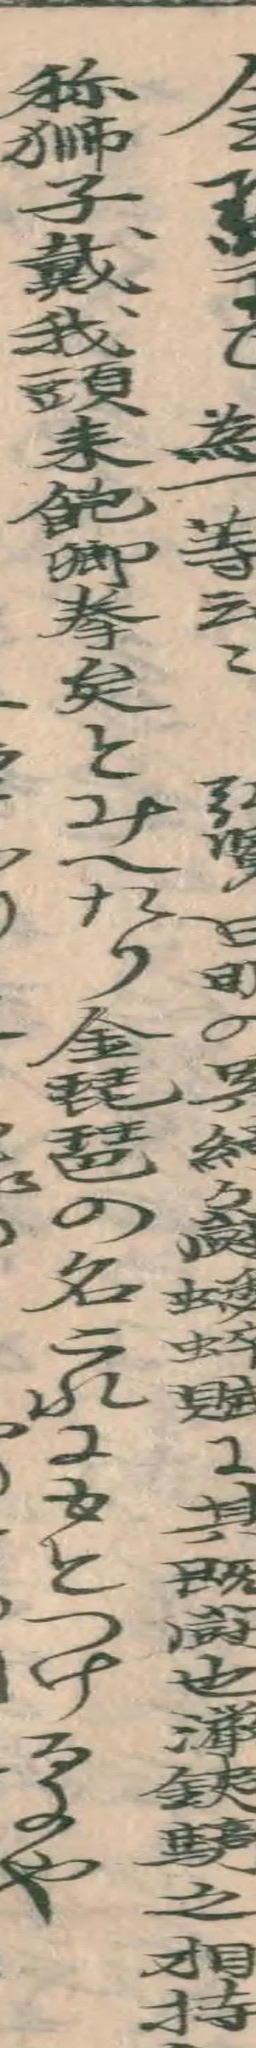称獅子戴我頭来飽卿拳矣とみへたり金琵琶の名これにもとつけるにや
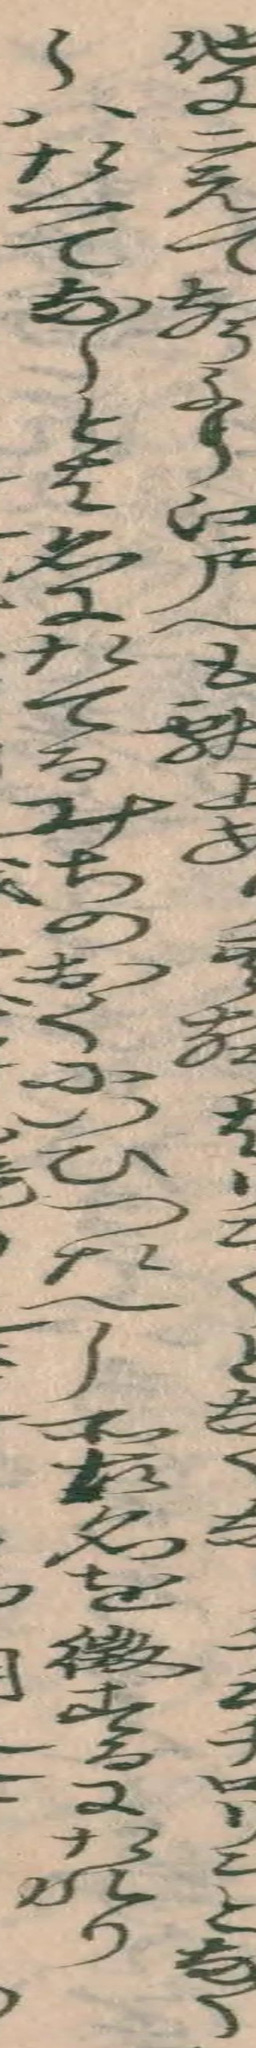しはたへてなしとは名にたてるみちのおくにいひつたへし所名を徴するにたれり
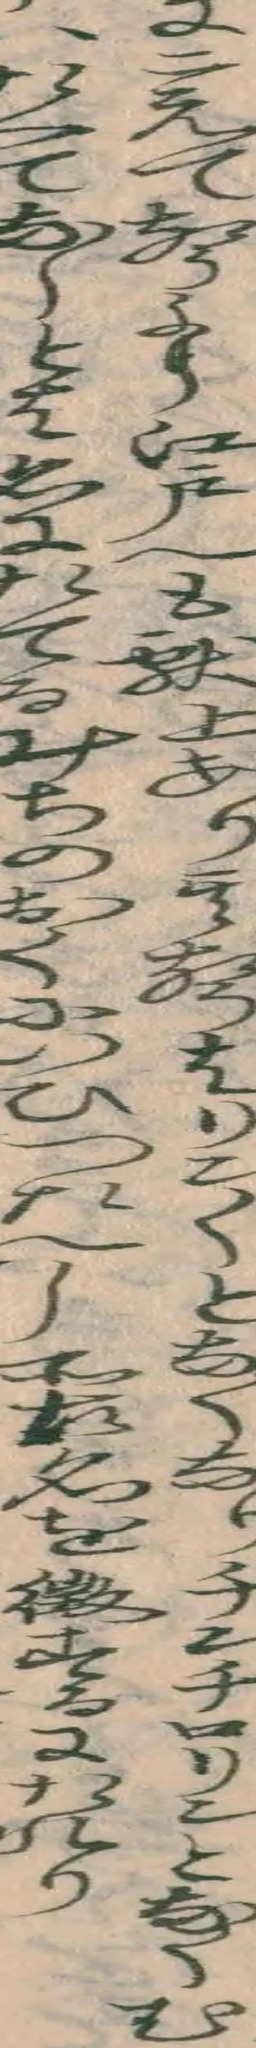しはたへてなしとは名にたてるみちのおくにいひつたへし所名を徴するにたれり
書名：千蟲譜 3巻. [3]
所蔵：国立国会図書館 National Diet Library, JAPAN
